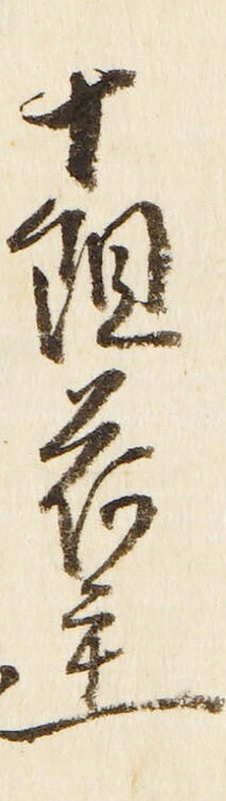十組荷主
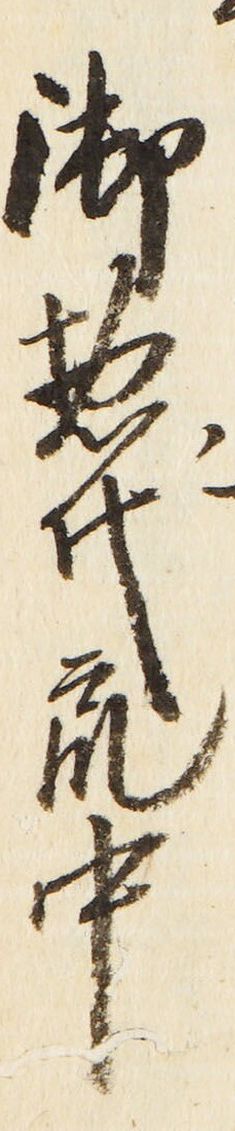御惣代衆中

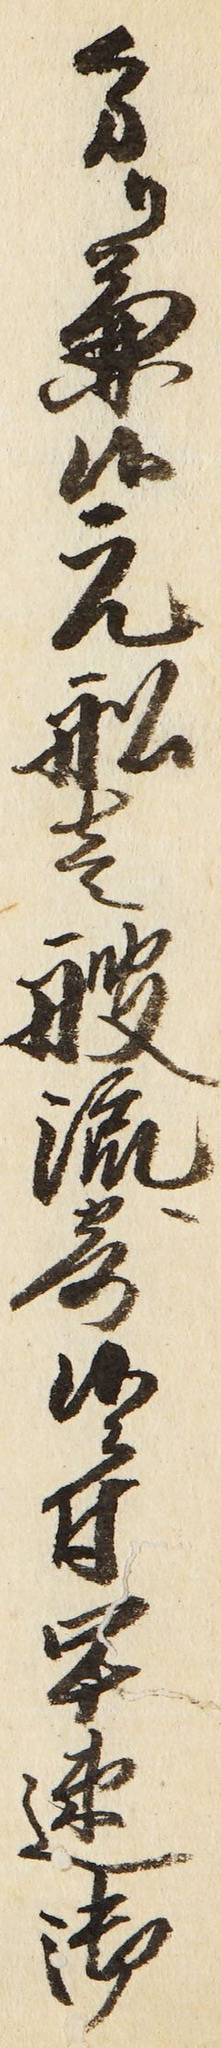分り兼候元船壱艘流寄候ニ付早速御
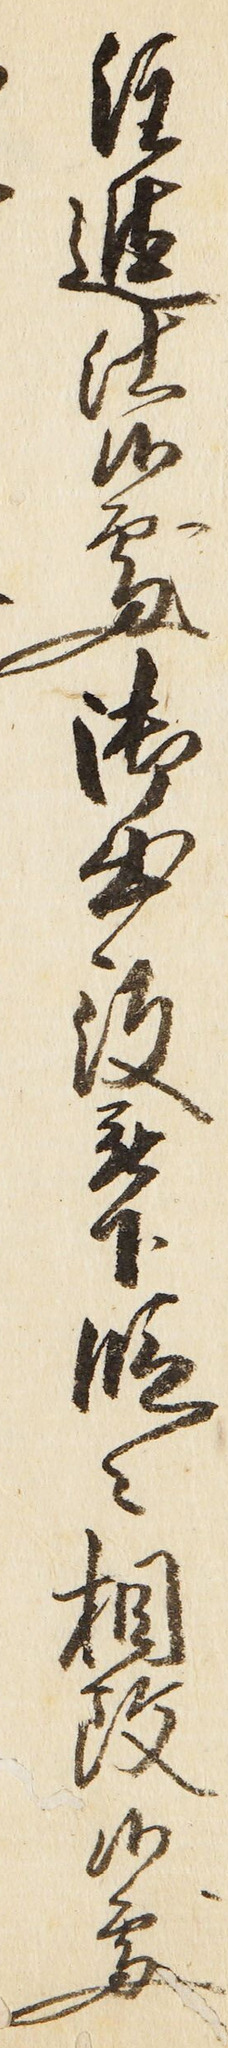注進仕候処御出役被下段々相改候処
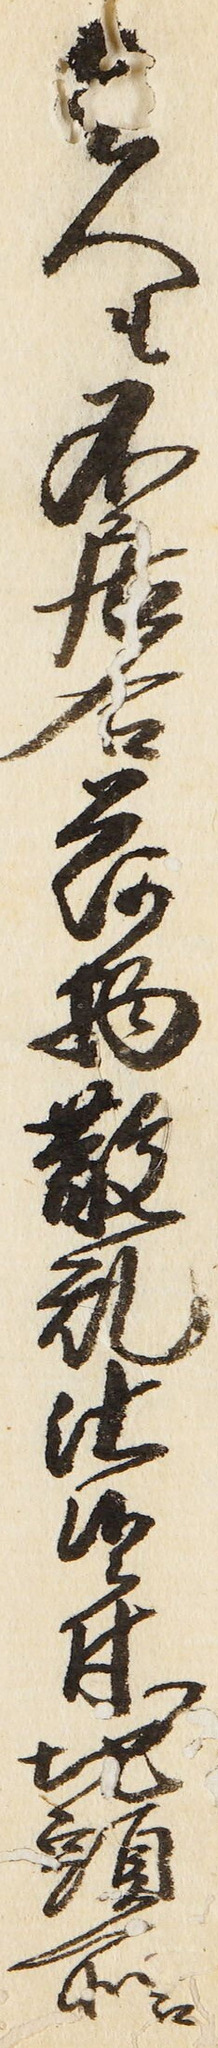壱人も不居合荷物散乱仕候ニ付地頭所江
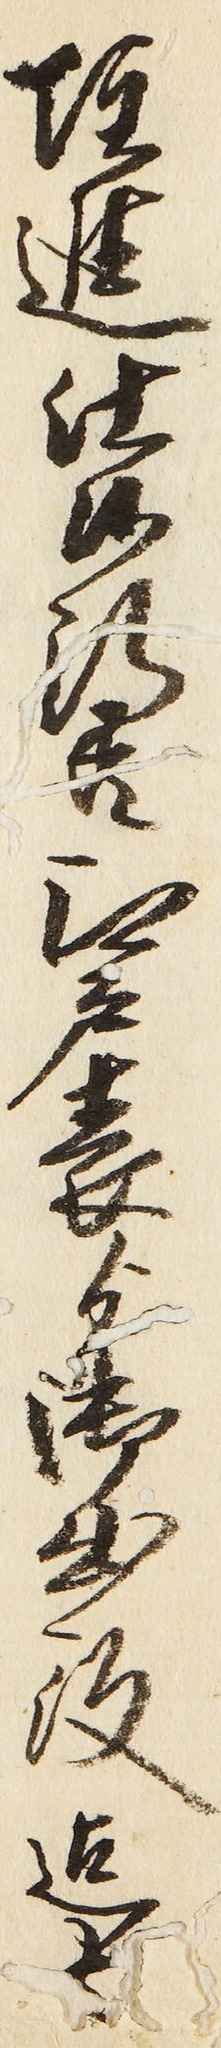注進仕候得共江戸表ゟ御出役迄者
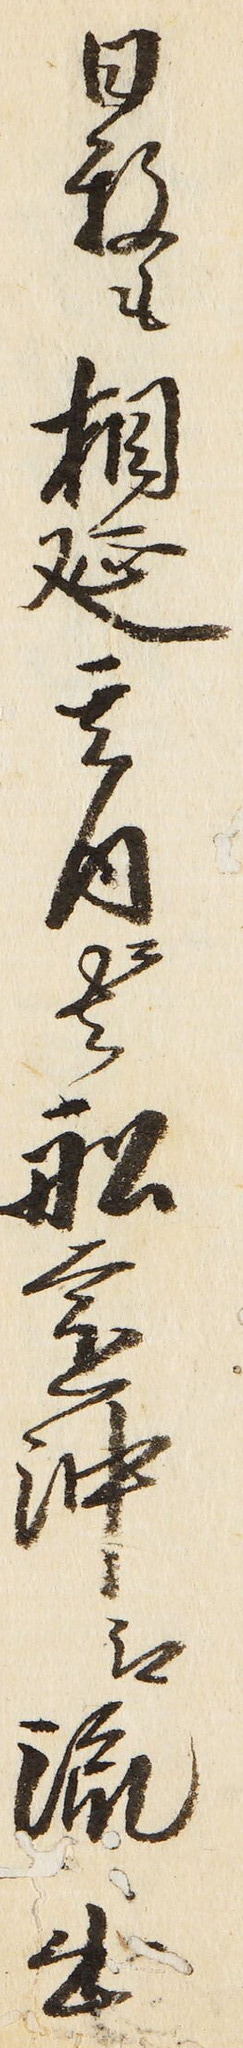日数も相延其内ニ者船遠沖江流出
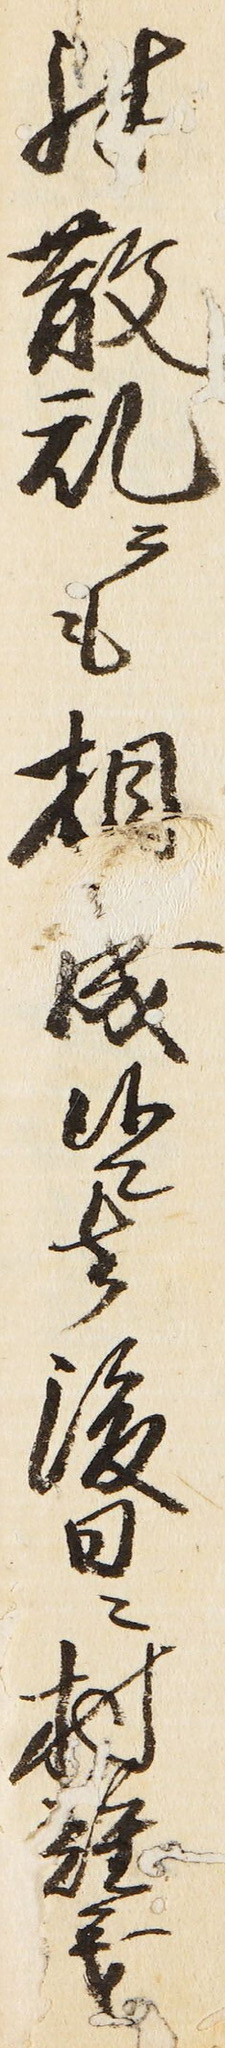散乱ニも相成候て者後日ニ村難義
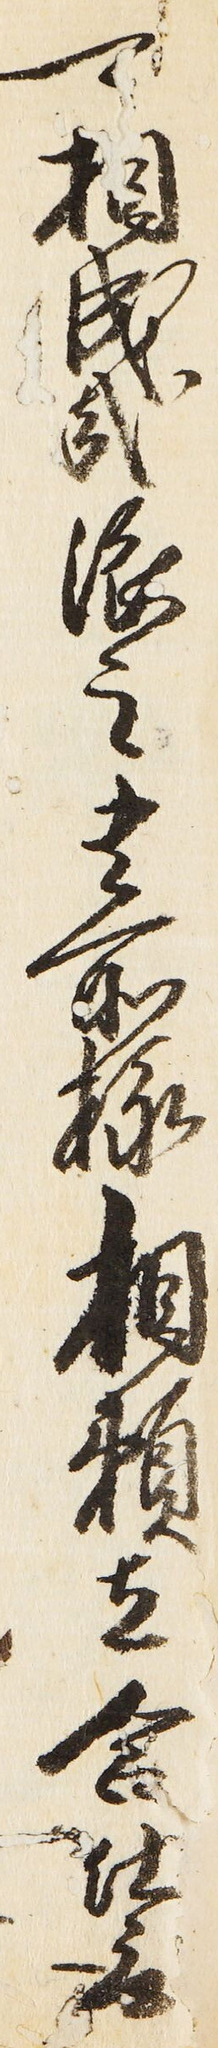可相成哉依之貴所様相頼立合仕取
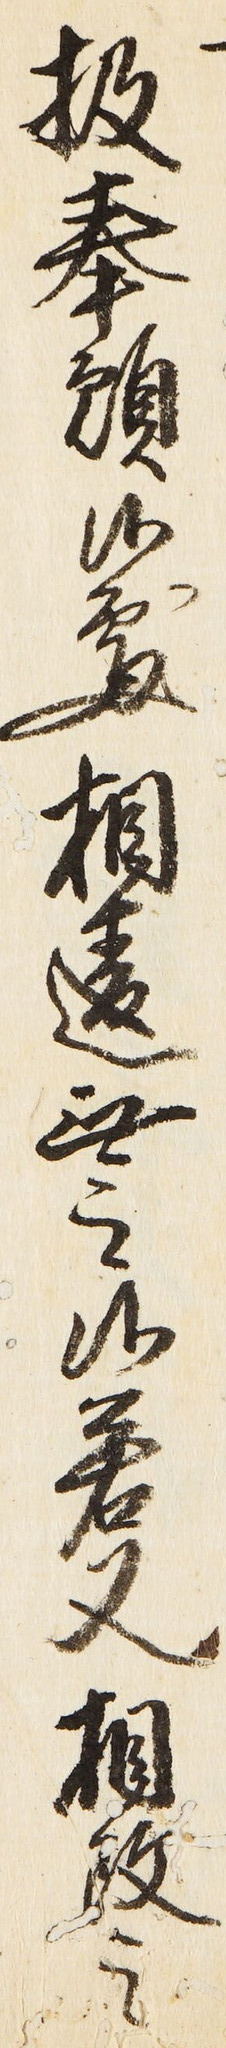扱奉願候処相違無之候若又相改之
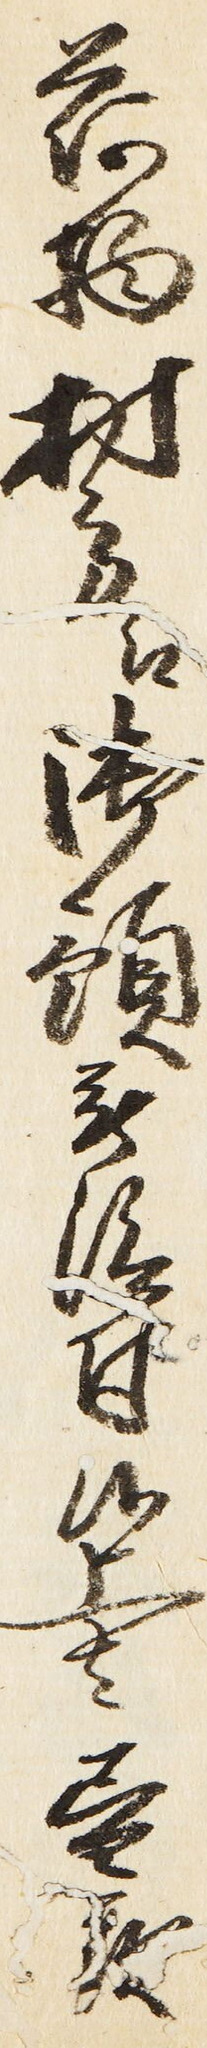荷物村方江御預被仰付候上者昼夜
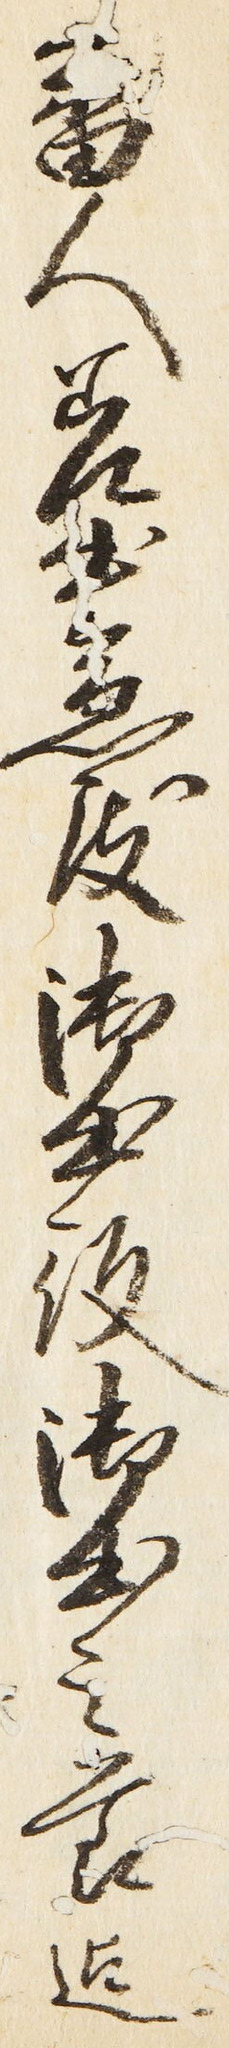番人差出急度御出役御出之節迄
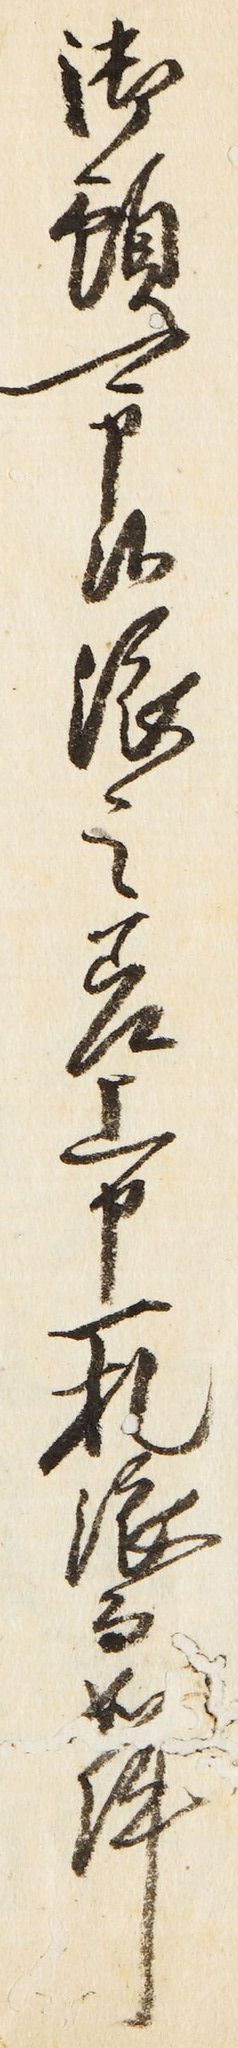御預可申候依之差上申一札依而如件
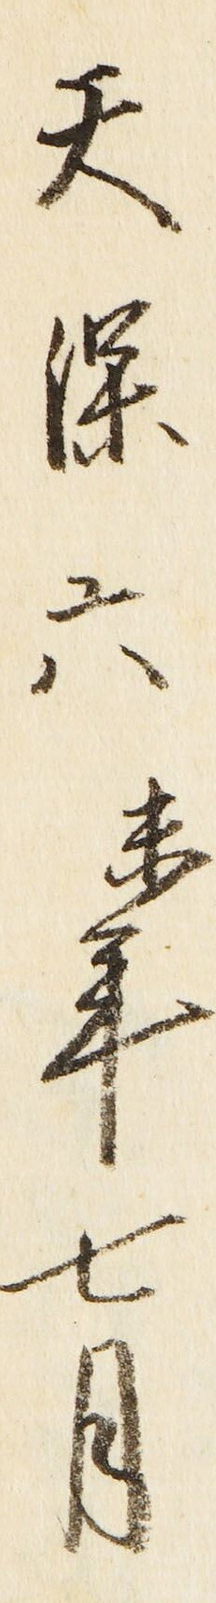天保六未年七月

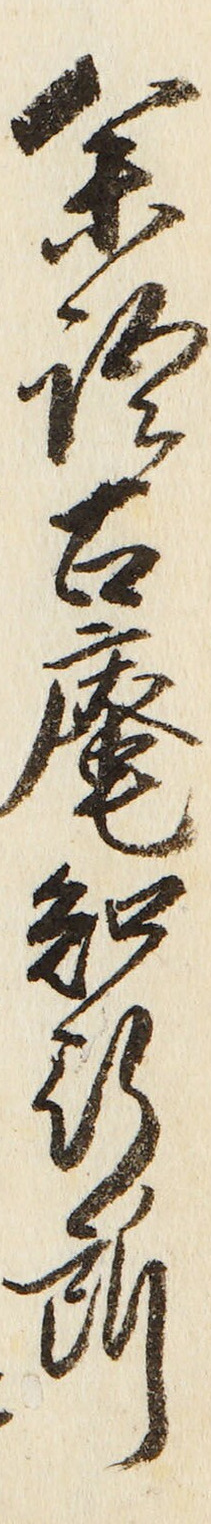余語古庵知行所
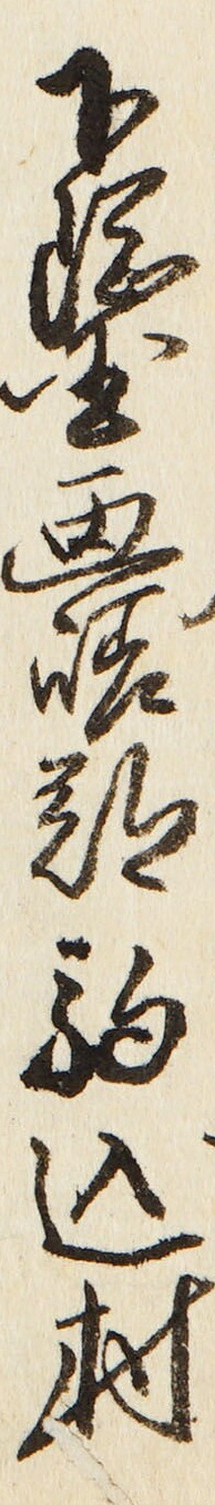下総国匝瑳郡駒込村
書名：難船一件記録
